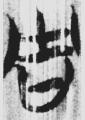周
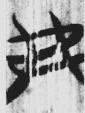弗
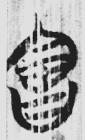會
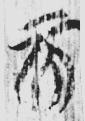而
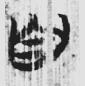自
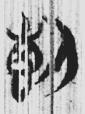○（斷）
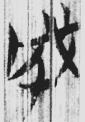成
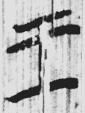王
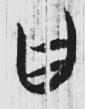曰
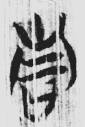青（請）
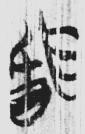䎽（問）
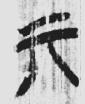亓（其）
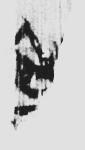事
